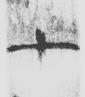七
